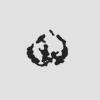墨
